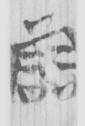霝
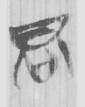君
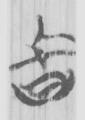旨
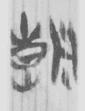朝
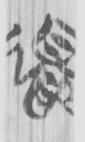{彳要}
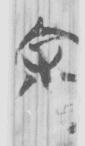余=
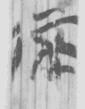伓
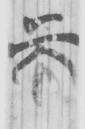而
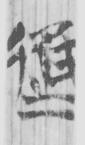進
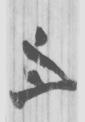之
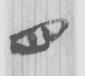四
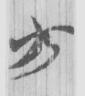方
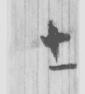十一
